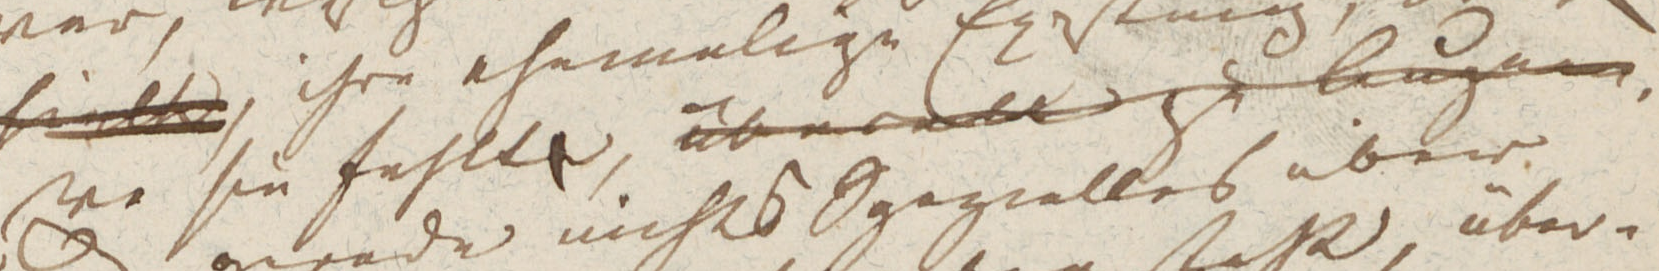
wo sie fehlte, überall zu leugnen,
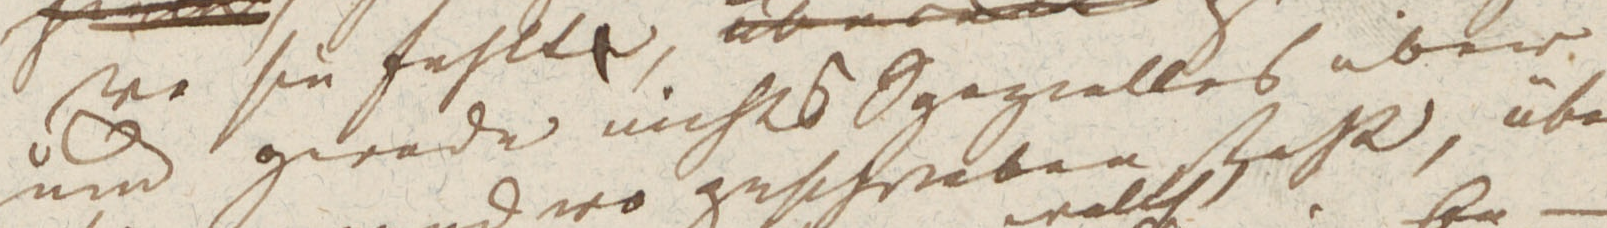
und gerade nichts Spezielles über
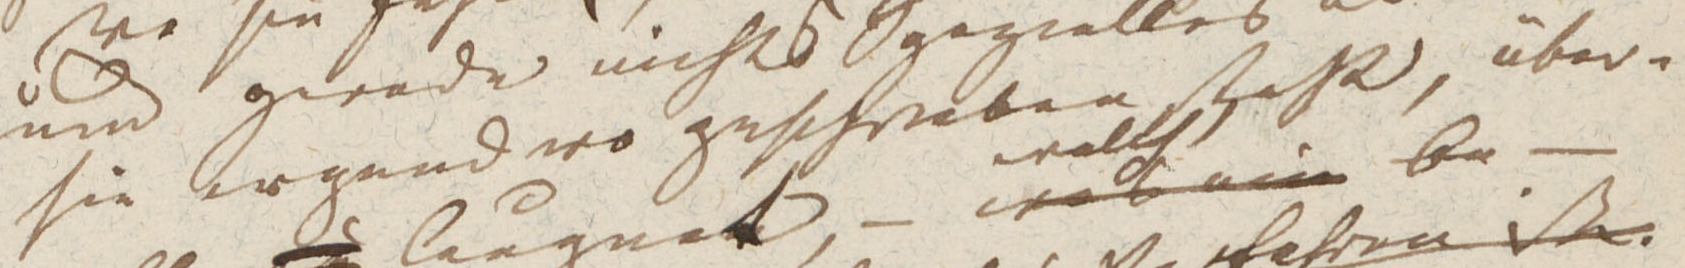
sie irgend wo geschrieben steht, über-
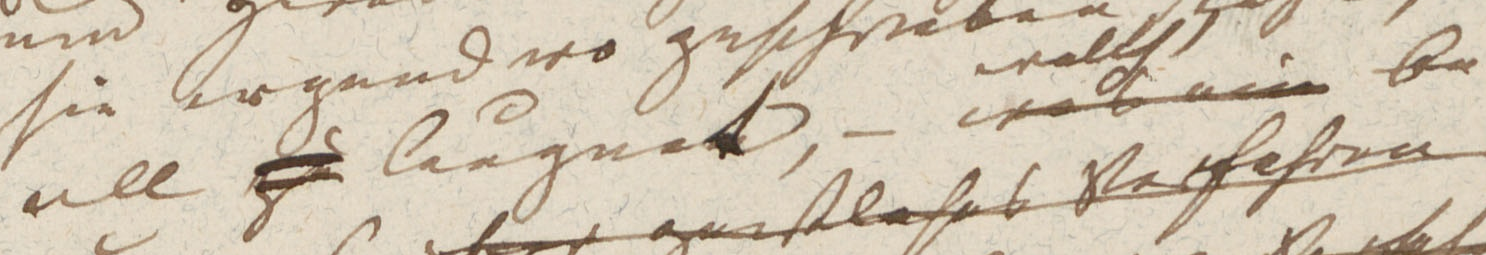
all zu leugnent, – was ein welch' be-
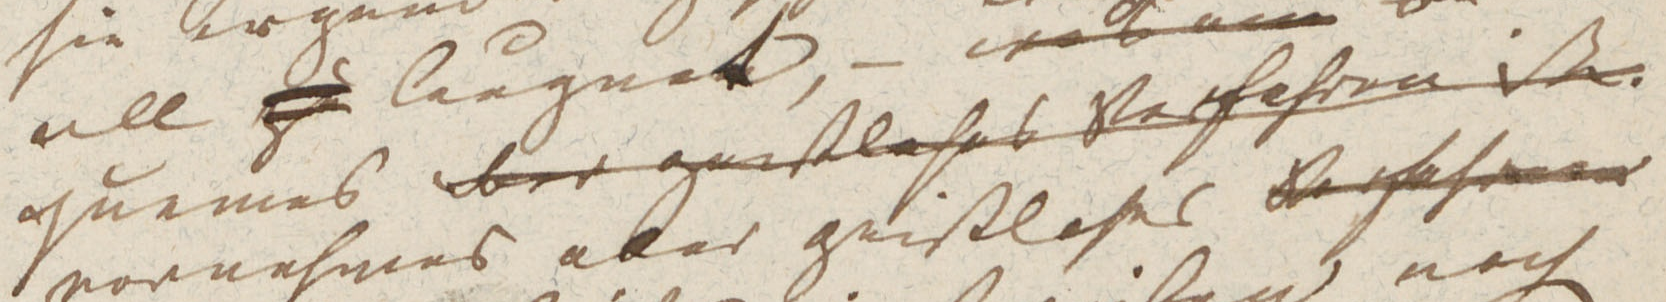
quemes aber geistloses Verfahren ist.
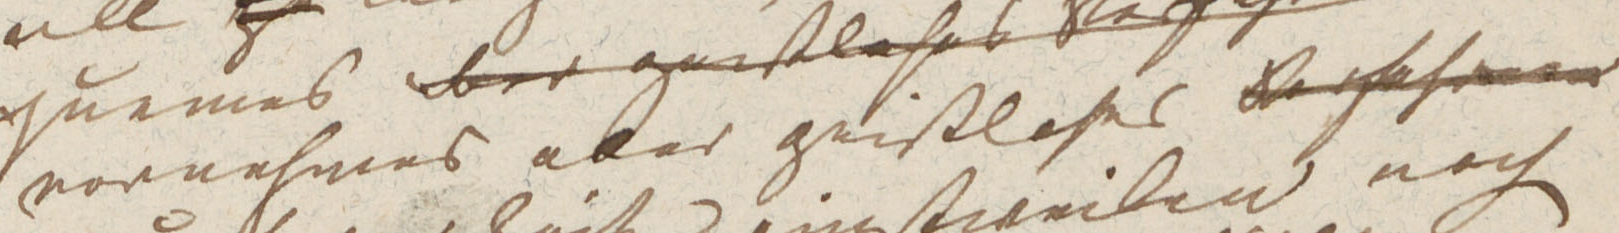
vornehmes aber geistloses Verfahren
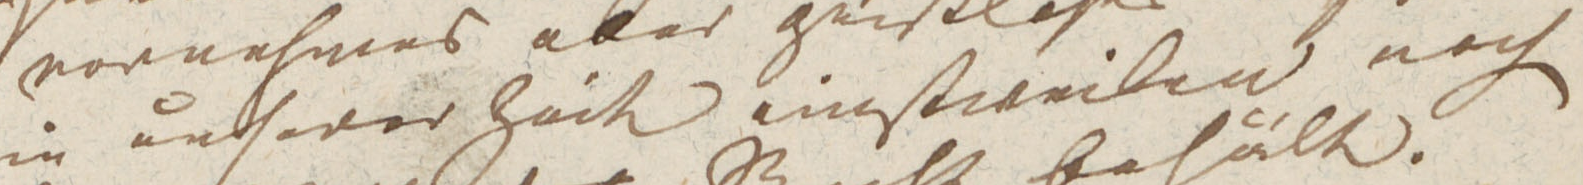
in unserer Zeit einstweilen noch
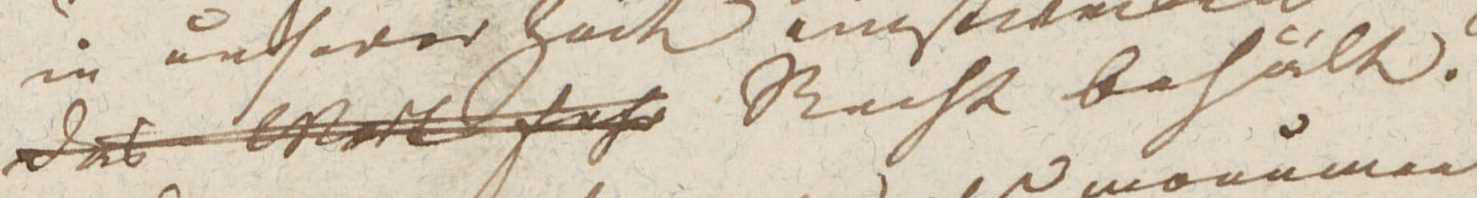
das Wort feh Recht behält.
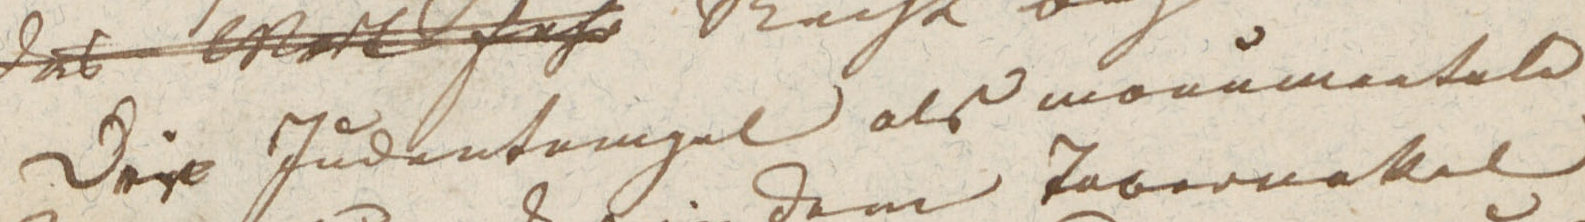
Dieer Judentempel als monumentale
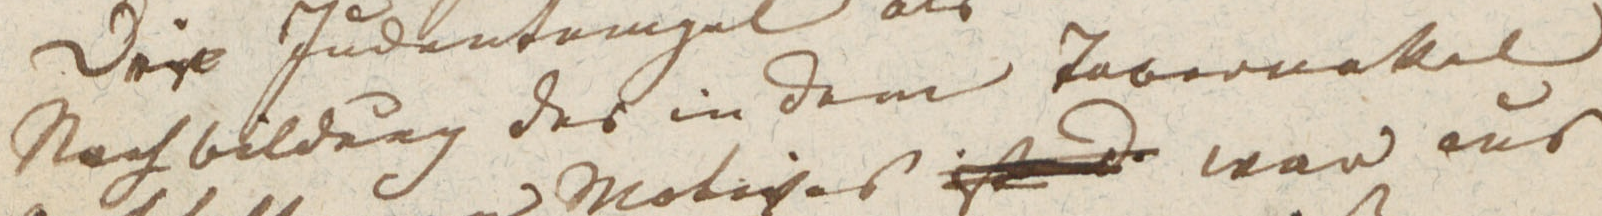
Nachbildung des in dem Tabernakel
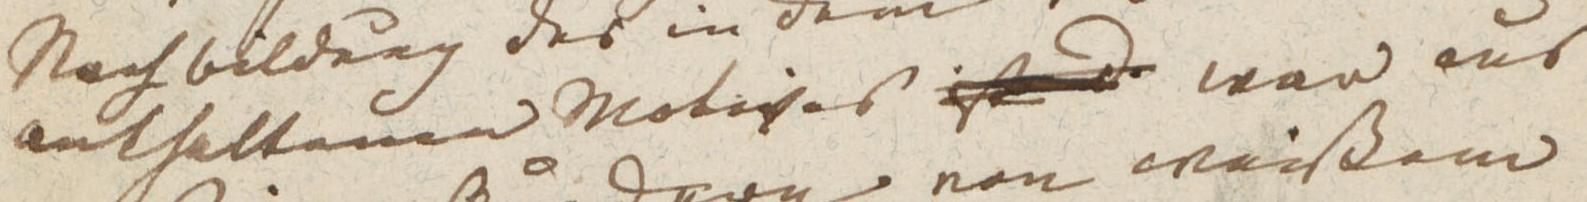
enthaltenen Motives ist d war aus
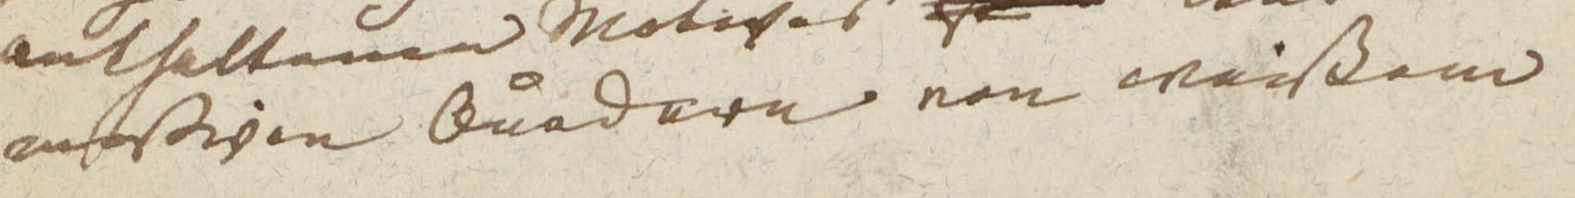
massiven Quadern von weissem
